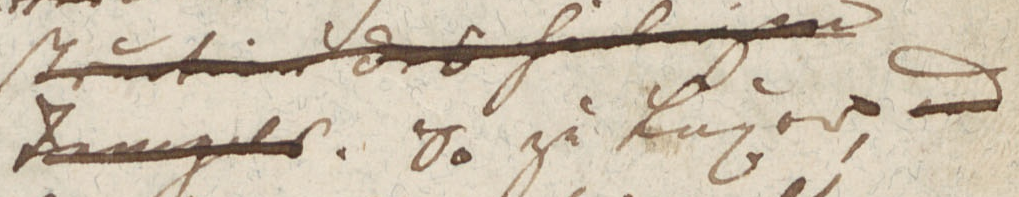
Tempels. So zu Luxor, und
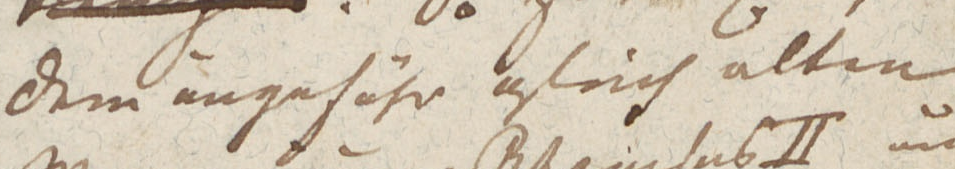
dem ungefähr gleich alten
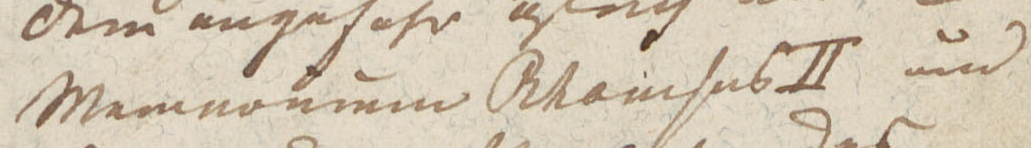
Memnonium Rhamses II und
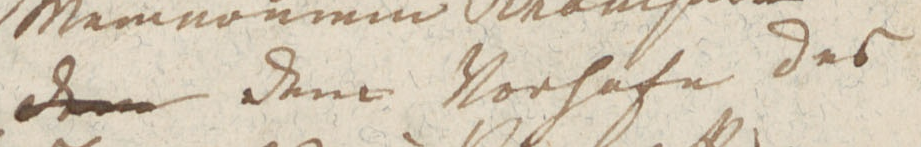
dem dem Vorhofe des
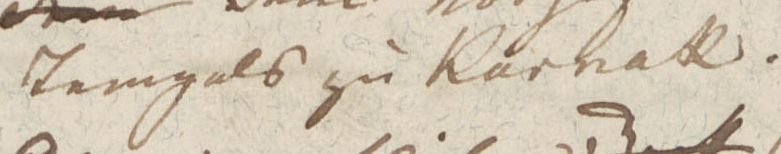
Tempels zu Karnak.
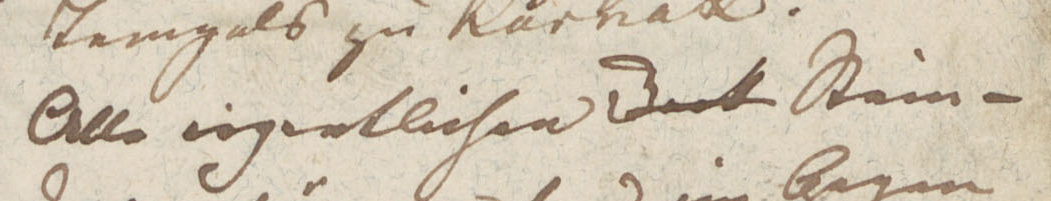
Alle eigentlichen Deck Stein-
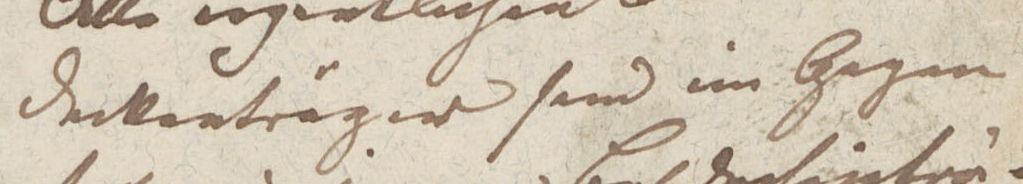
deckenträger sind im Gegen
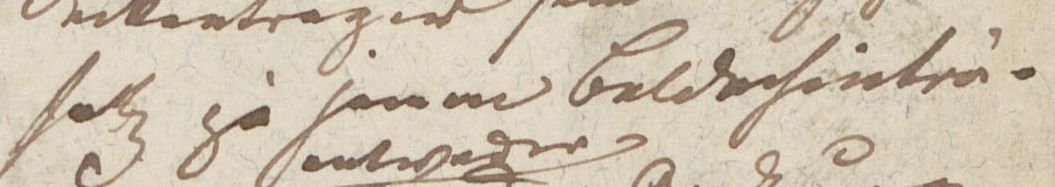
satz zu jenen Baldachinträ-
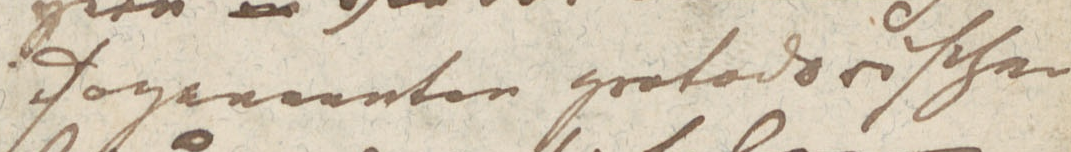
sogenannten protodorischen
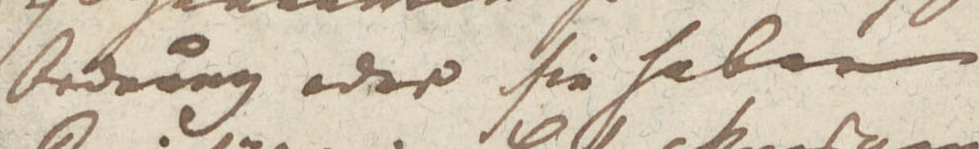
Ordnung oder sie haben
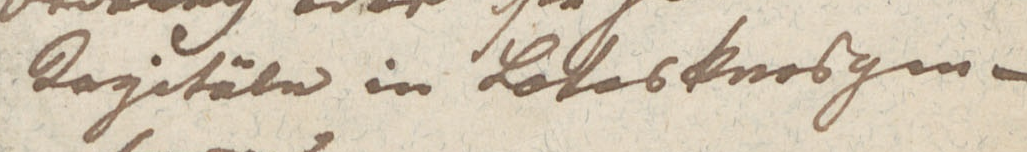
Kapitäle in Lotosknospen-
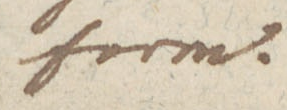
form.
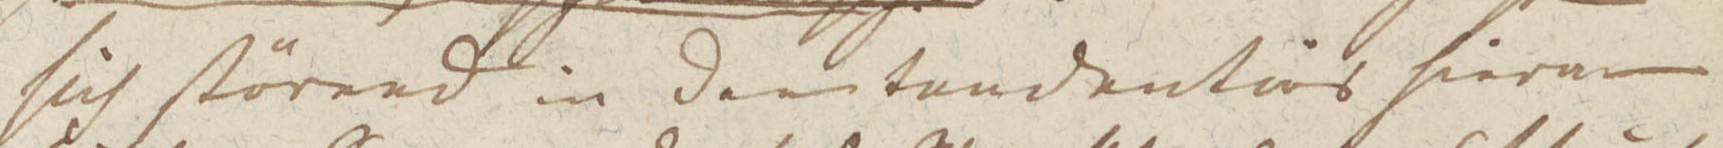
sich störend in dem tendentiös hiera-
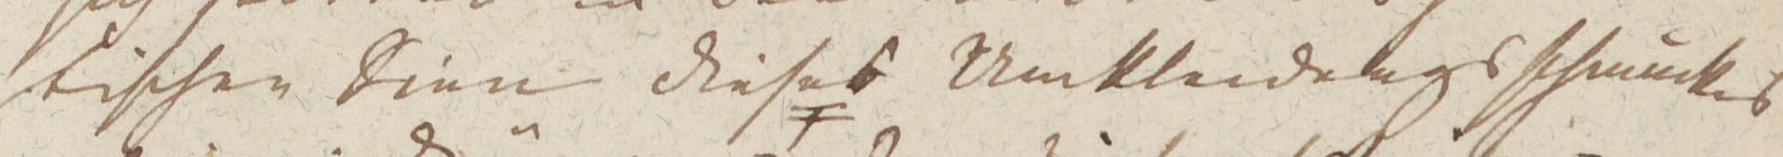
tischen Sinn dieses Umkleidungsschmuckes
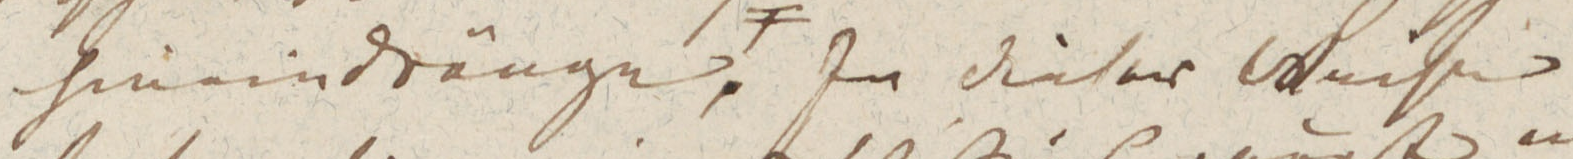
hineindränge,. % In dieser Weise
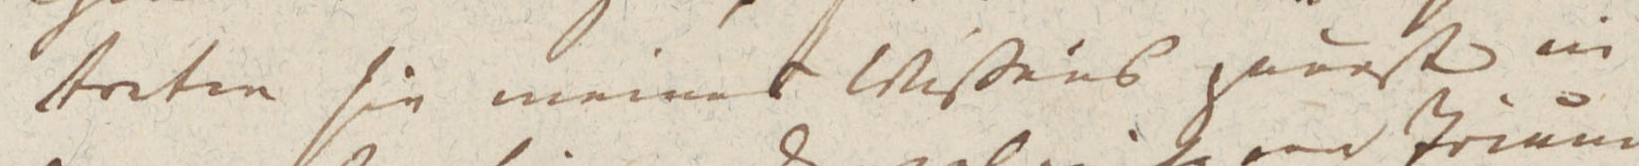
treten sie meines Wissens zuerst in
